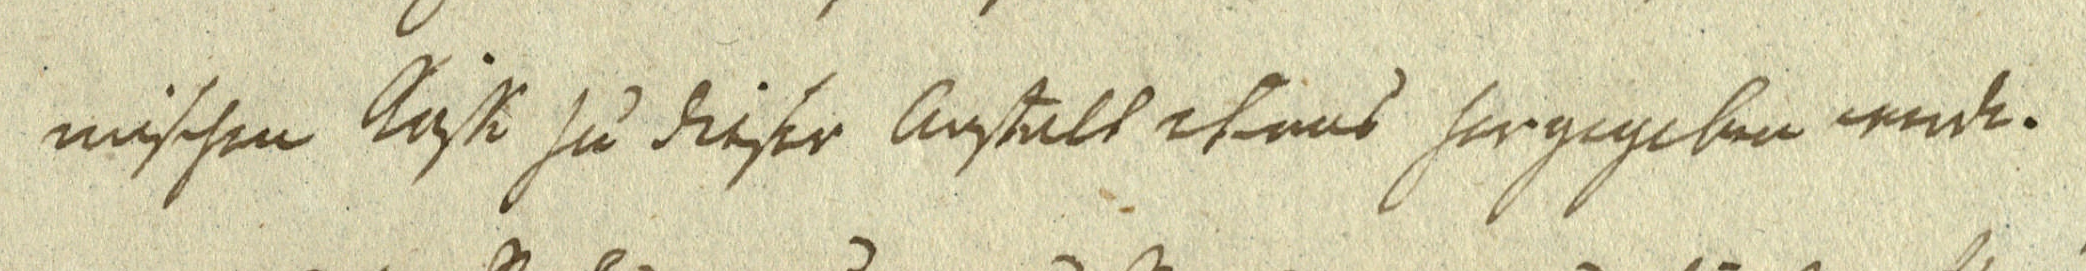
mischen Kasse zu dieser Anstalt etwas hergegeben werde.
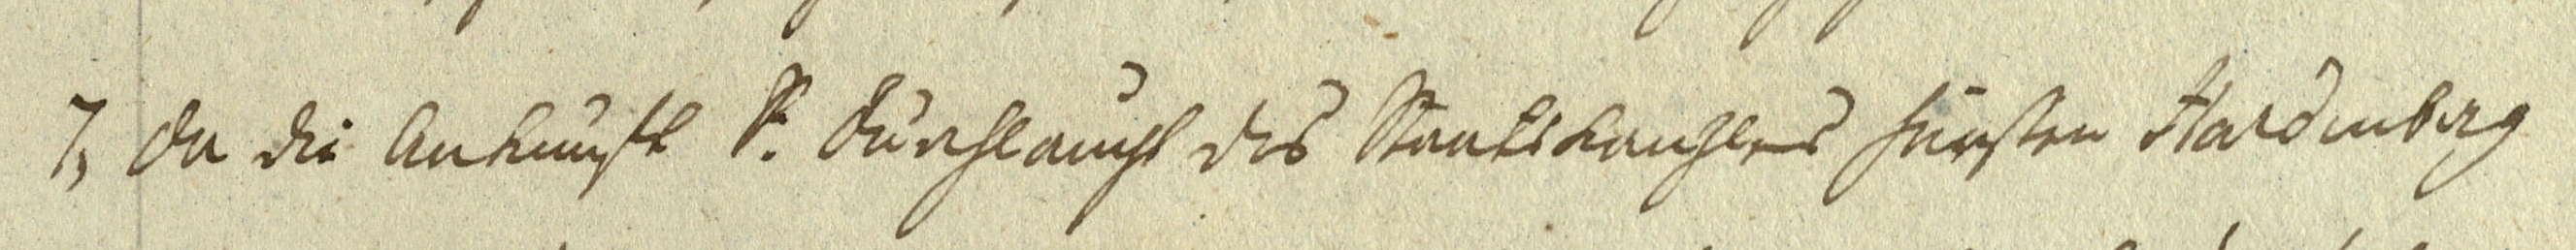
7, Da die Ankunft Sr. Durchlaucht des Staatskanzlers Fürsten Hardenberg
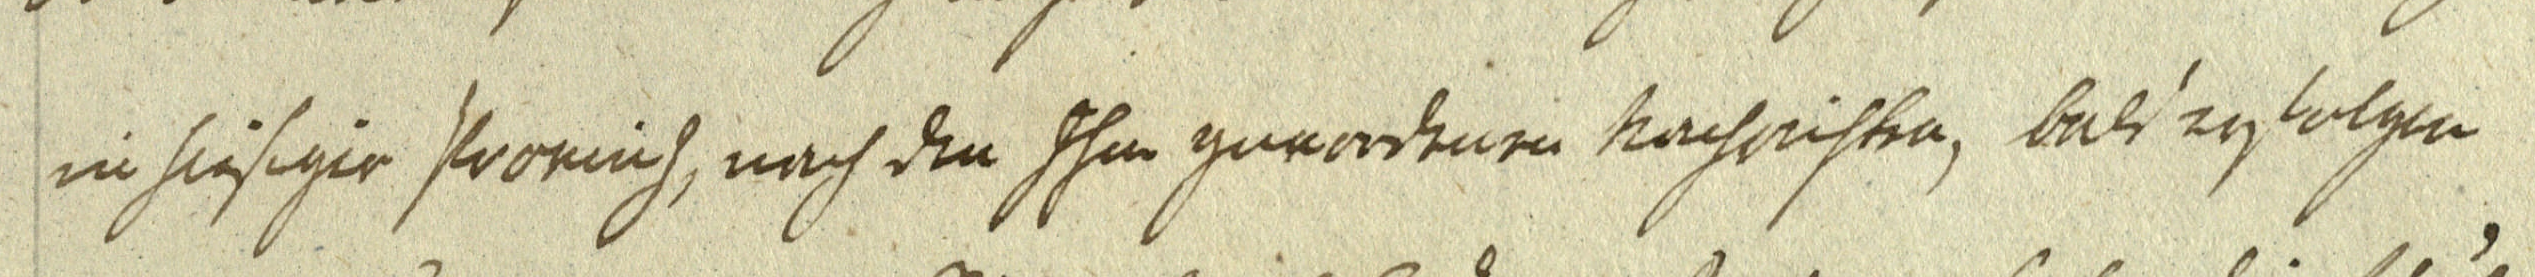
in hiesiger Provinz, nach den Ihm gewordenen Nachrichten, bald erfolgen
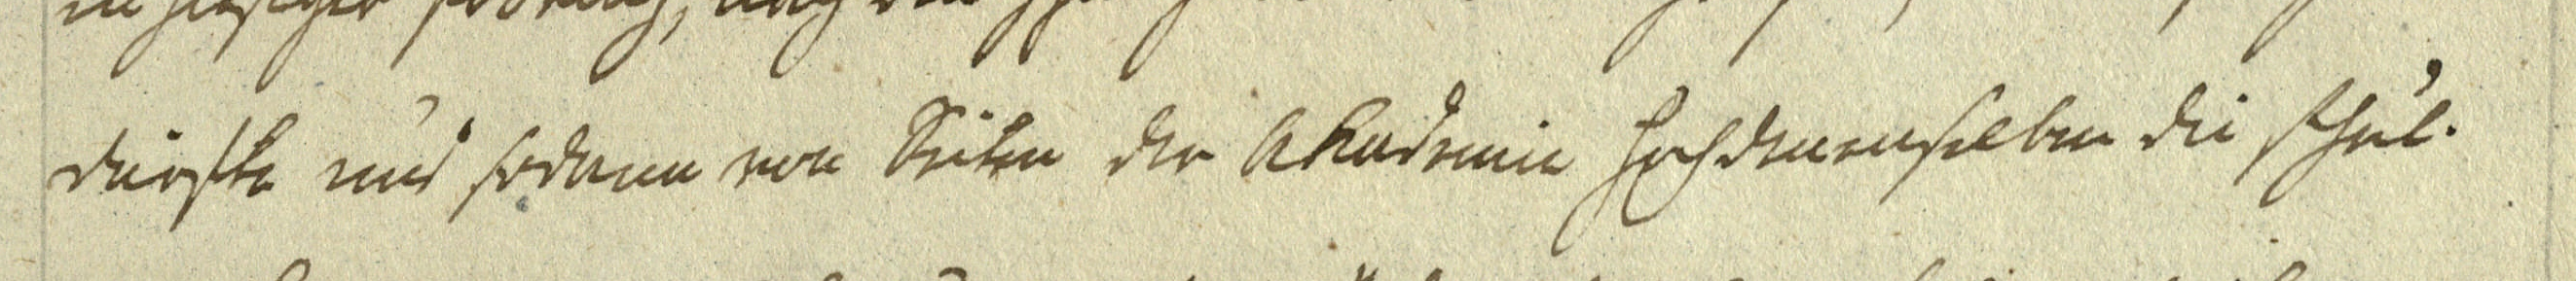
dürfte und sodann von Seiten der Akademie Hochdenenselben die schul¬
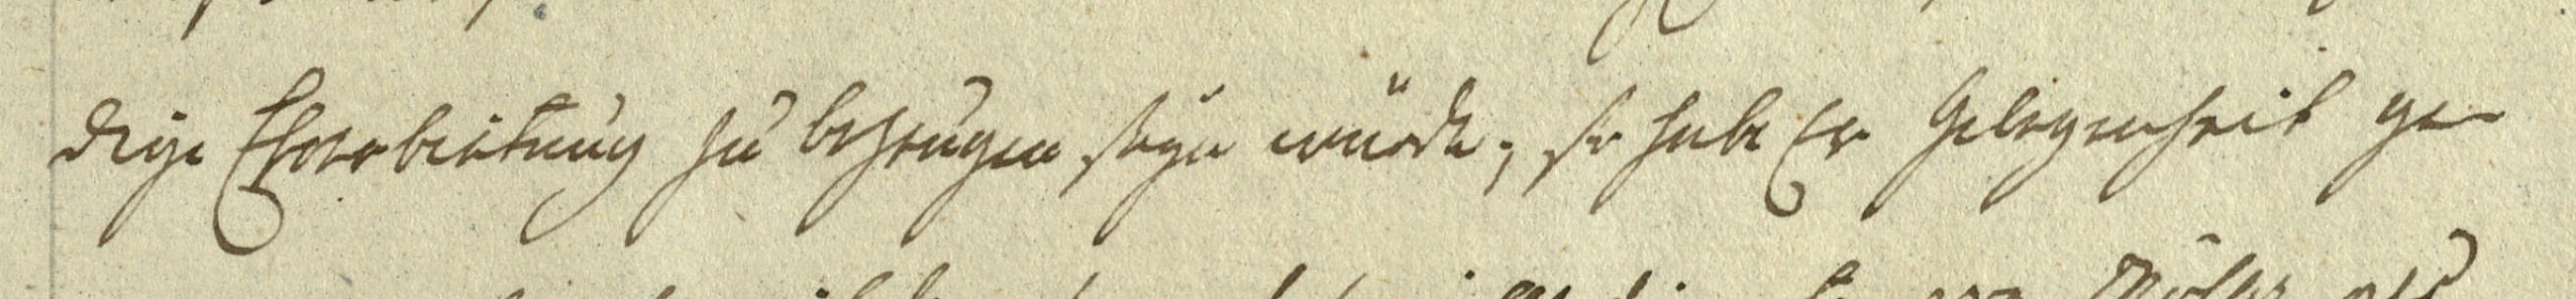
dige Ehrerbietung zu bezeugen seÿn würde, so habe Er Gelegenheit ge¬
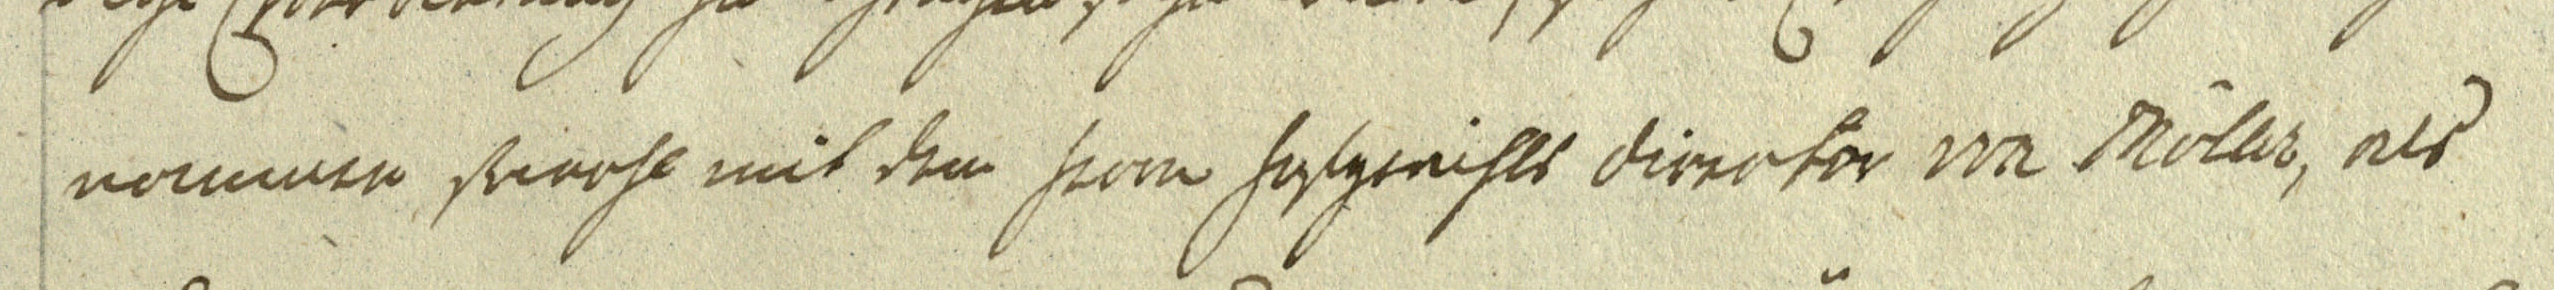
nommen sowohl mit den Herrn Hofgerichts Director von Möller, als
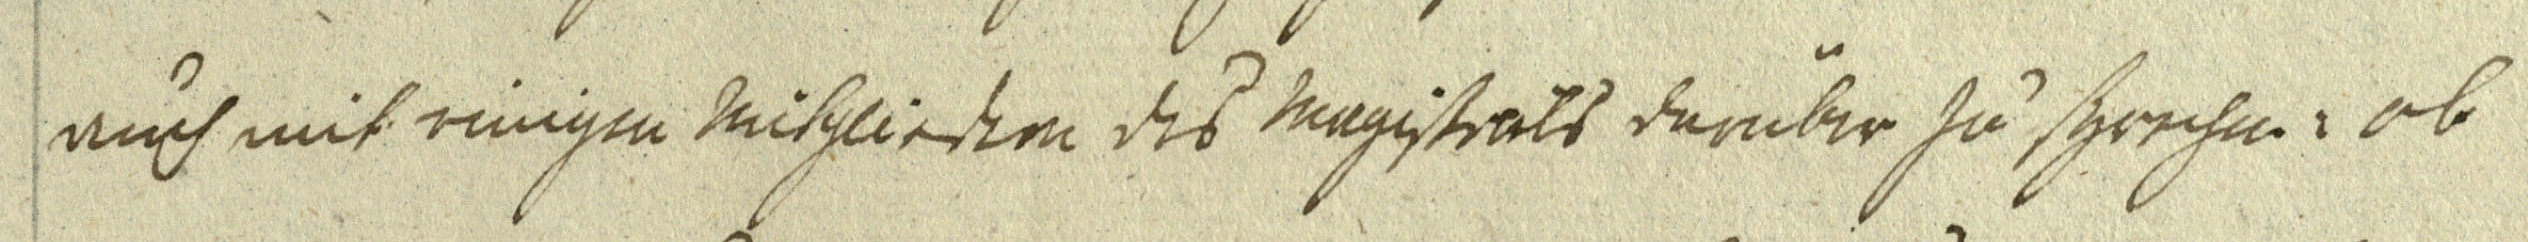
auch mit einigen Mitgliedern des Magistrats darüber zu sprechen: ob
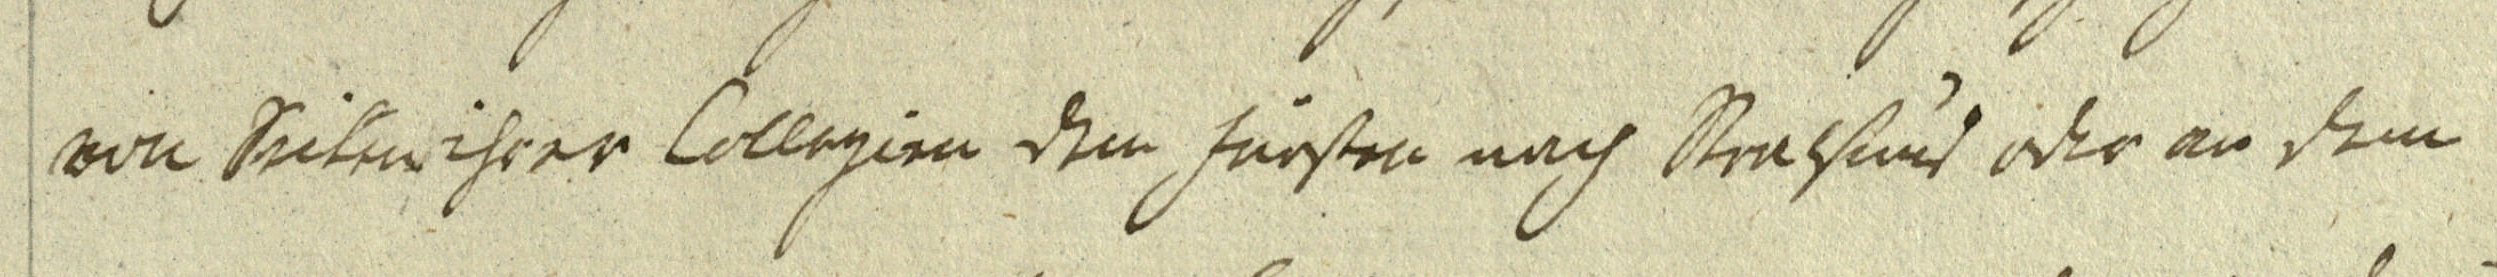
von Seiten ihrer Collegien dem Fürsten nach Stralsund oder an dem
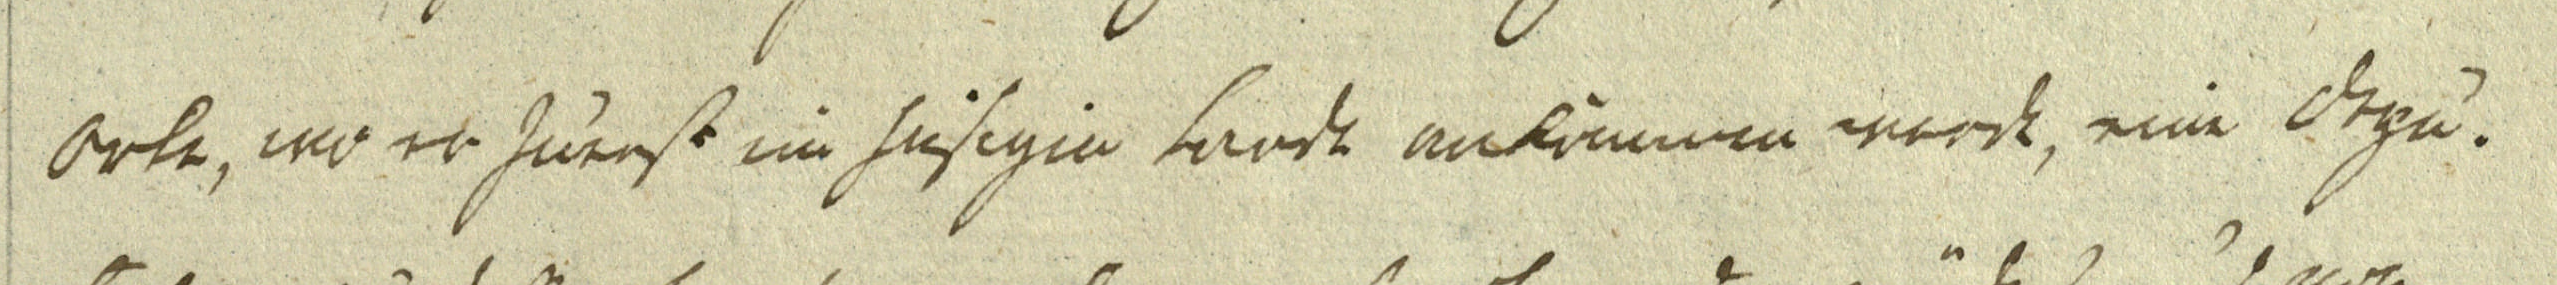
Orte, wo er zuerst im hiesigen Lande ankommen werde, eine Depu¬
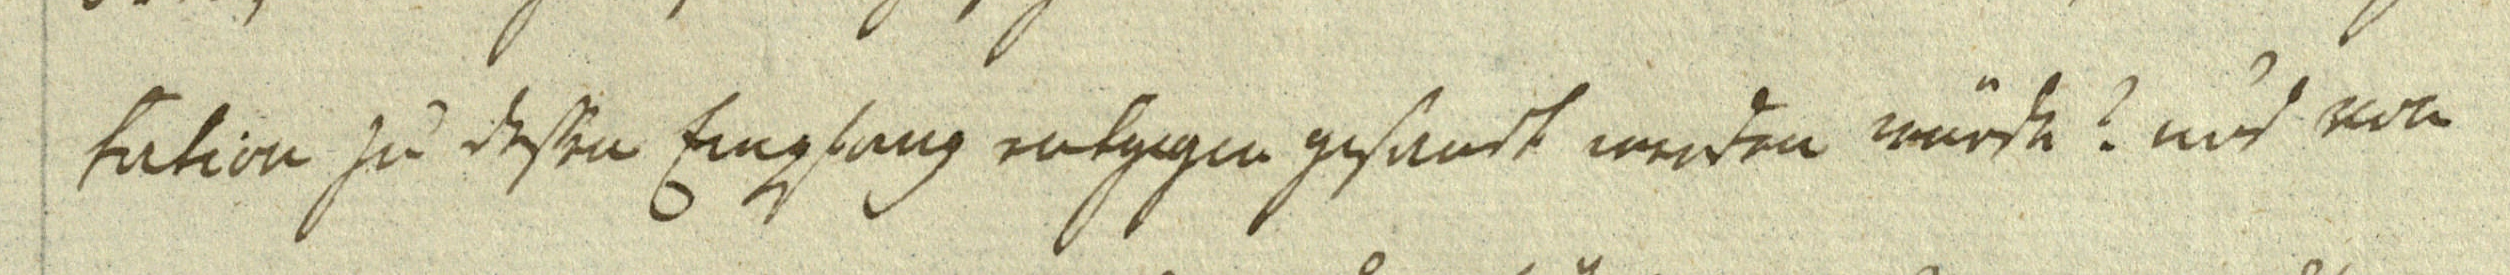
tation zu dessen Empfang entgegen gesandt werden würde? und von
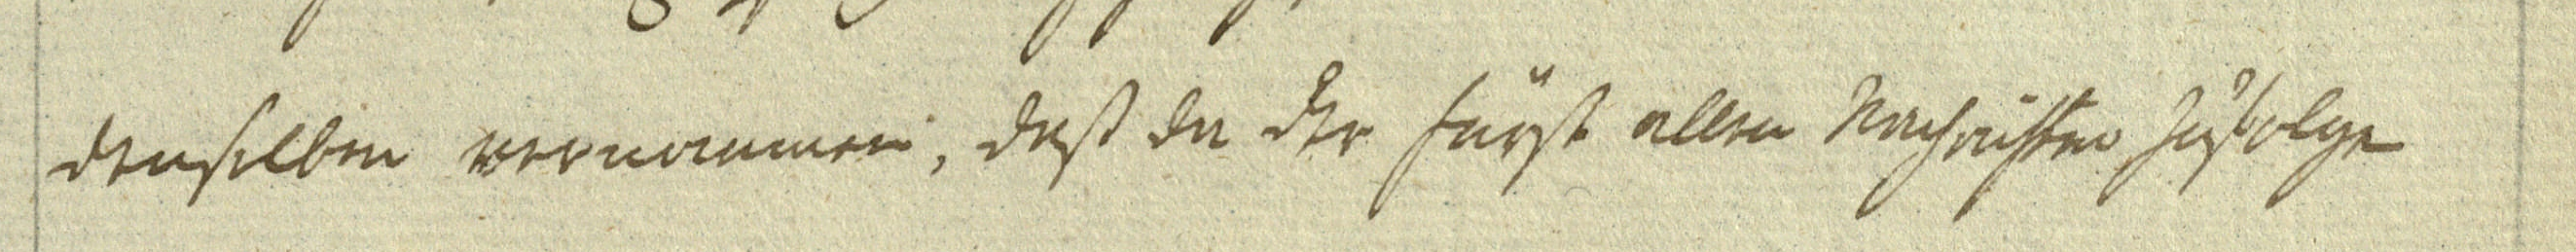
denselben vernommen; daß da der Fürst allen Nachrichten zufolge
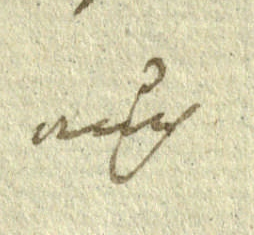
auch
